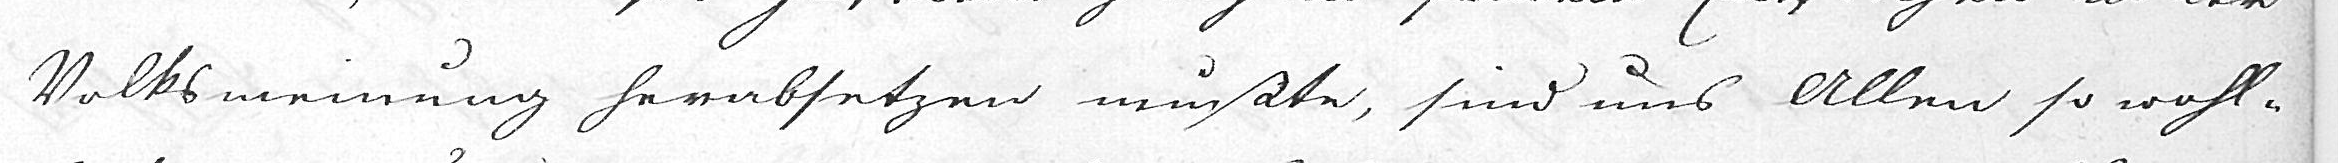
Volksmeinung herabsetzen mußte, sind uns Allen so wohl-
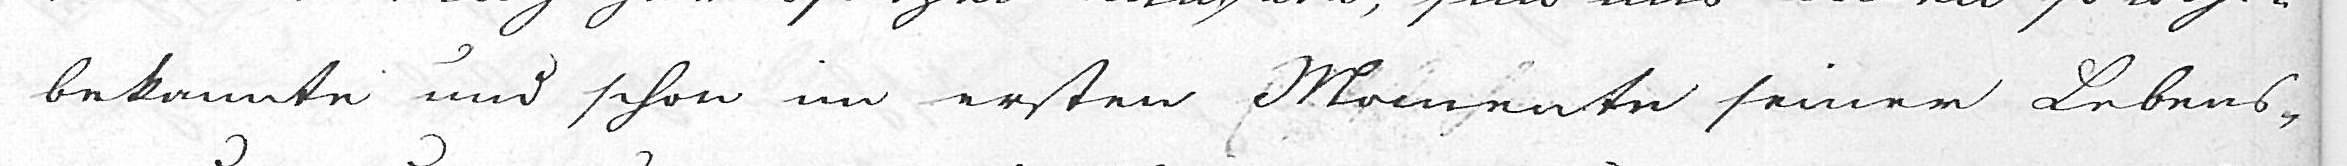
bekannte und schon im ersten Monate seiner Lebens-
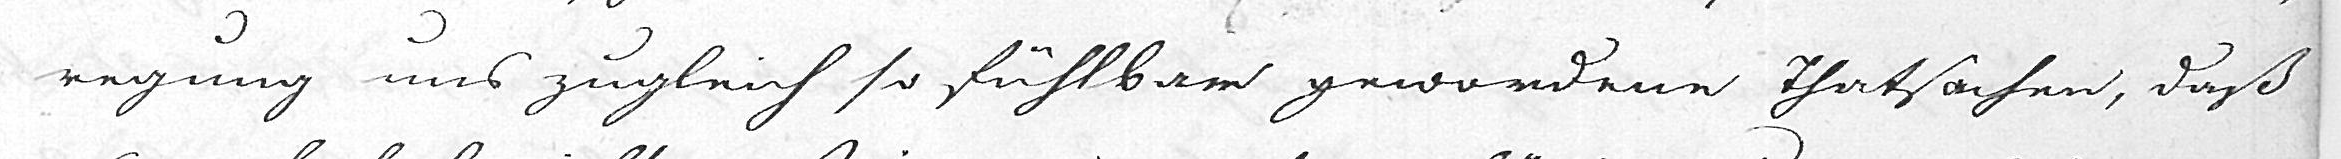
regung und zugleich so fühlbar gewordene Thatsachen, daß
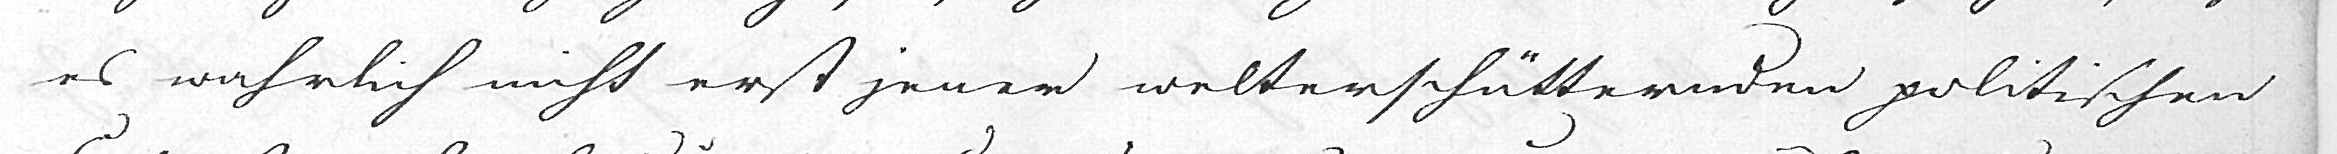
es wahrlich nicht erst jener welterschütternden politischen
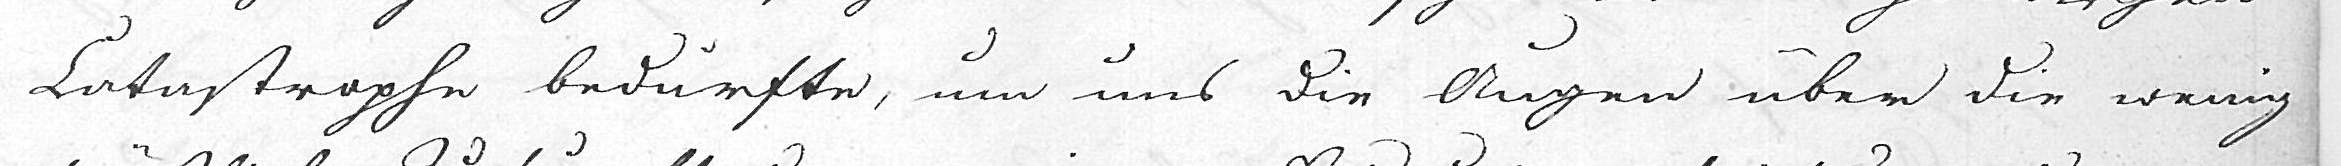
Catastraphe bedurfte, um uns die Augen über die wenig
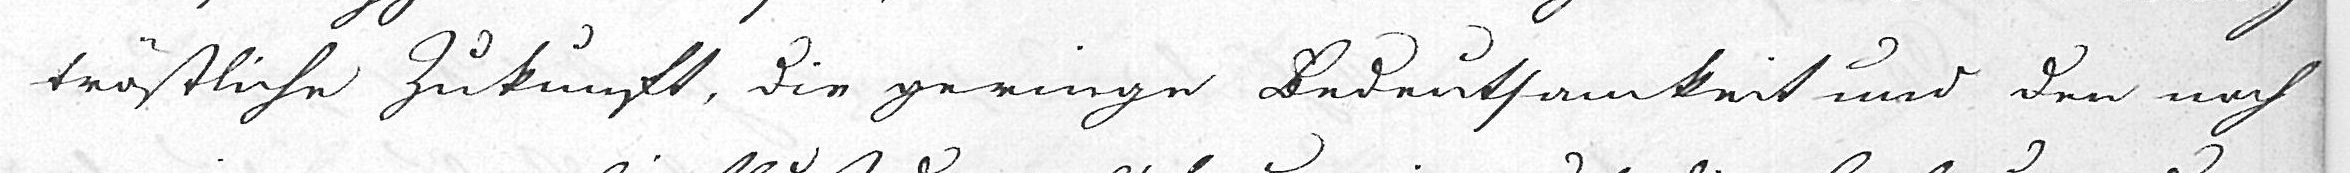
tröstliche Zukunft, die geringe Bedeutsamkeit und den noch
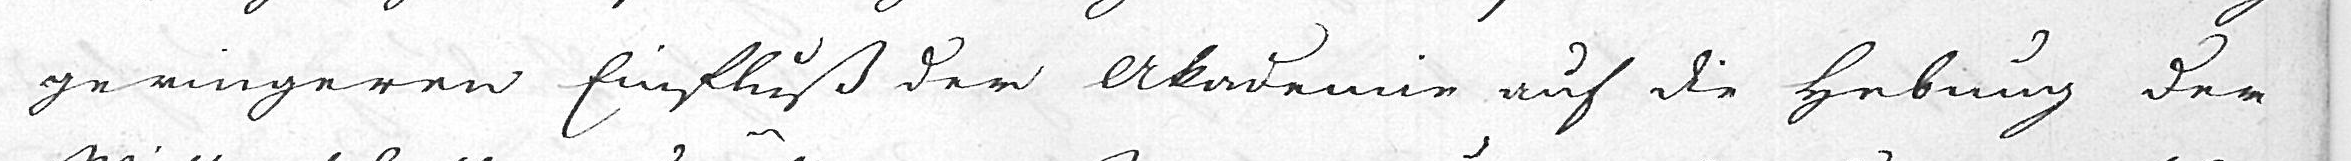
geringeren Einfluß der Akademie auf die Hebung der
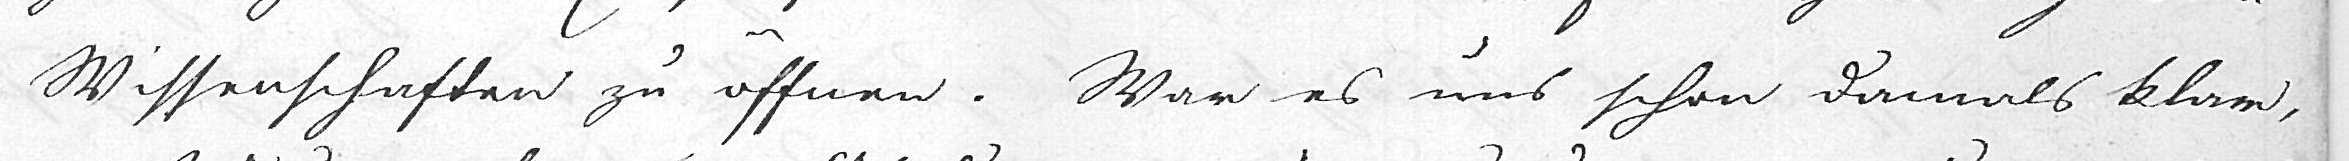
Wissenschaften zu öffnen. War es uns schon damals klar,
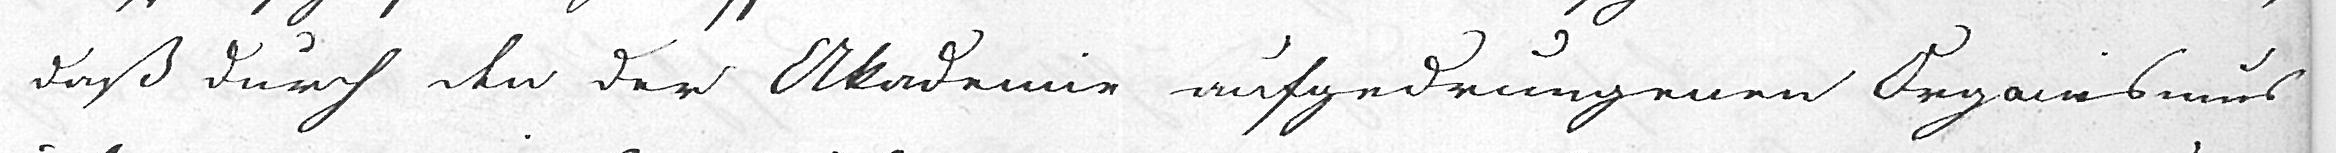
daß durch den der Akademie aufgedrungenen Organismus
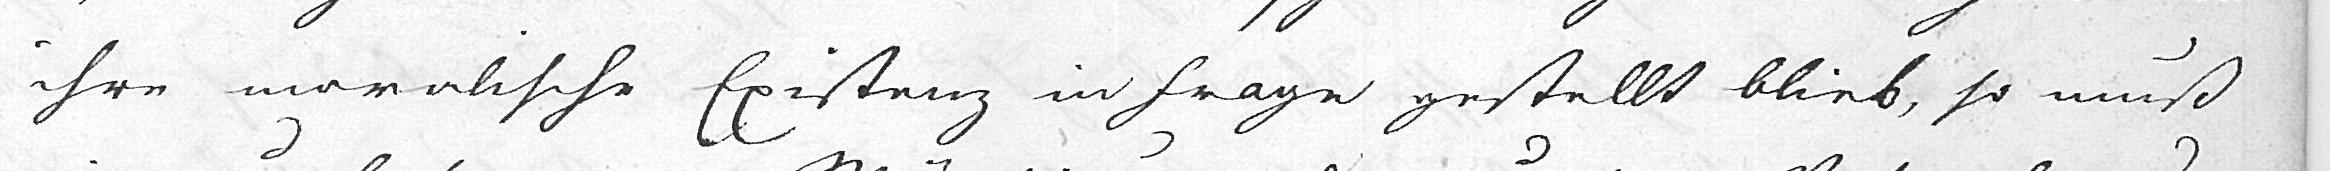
ihre moralische Existenz in Frage gestellt blieb, so muß
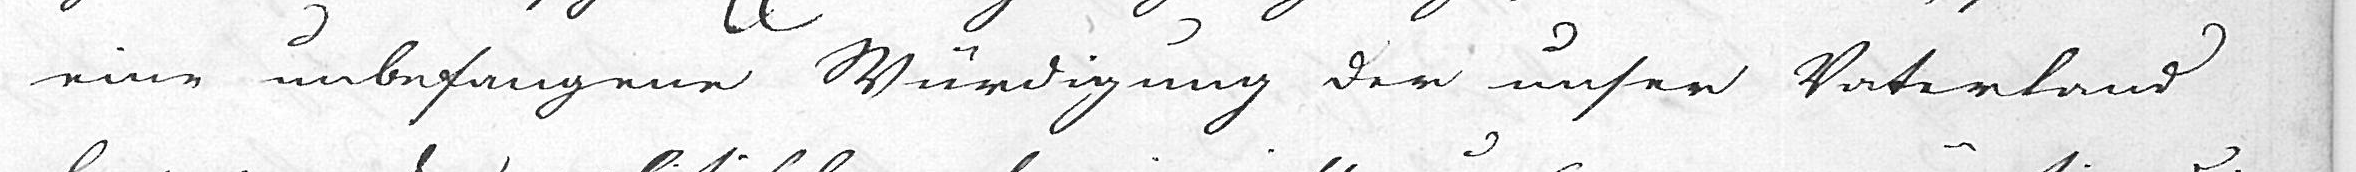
eine unbefangene Würdigung der unser Vaterland
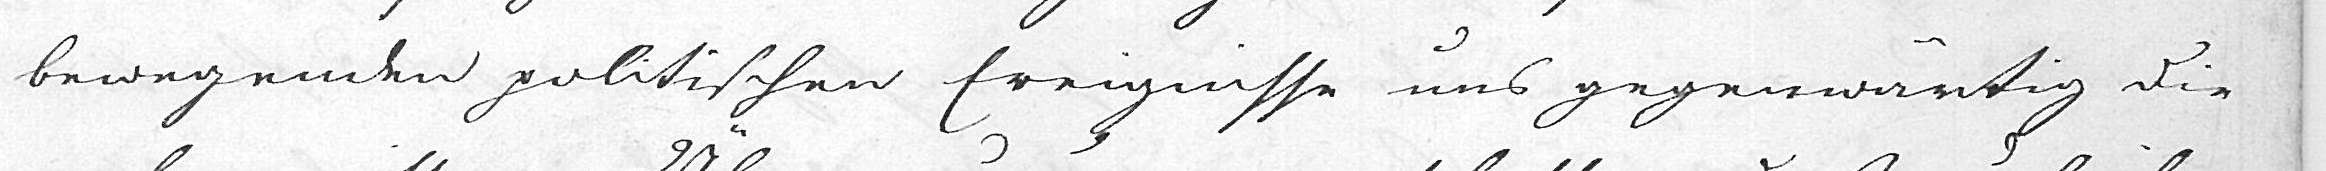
bewegenden politischen Ereignsse uns gegenwärtig die
